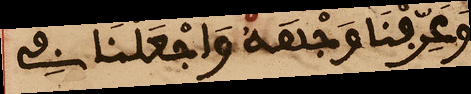و عرفنا وجهه واجعلنا في
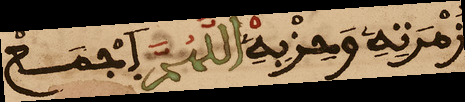زمرته و حزبه اللهم اجمع
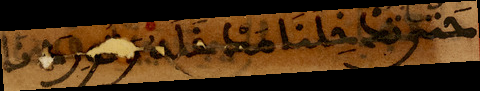# حتى تدخلنا مدخله
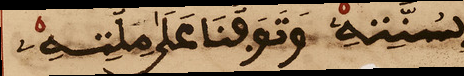بسنته و توفنا على ملته
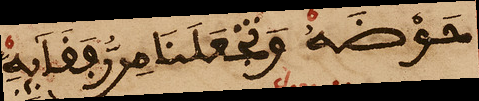حوضه و تجعلنا من رفقائه
